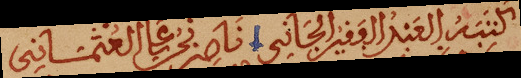كتبه العبد الفقير الجانى ناصر بن على العثماني
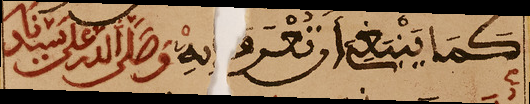كما ينبغى أن تعرفه وصلى الله على سيدنا
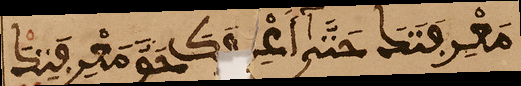معرفتك حتى آ أعرفك حو معرفتك
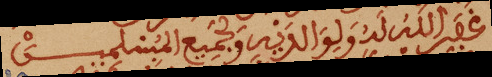غفرالله له ولوالديه ولجميع المسلمين
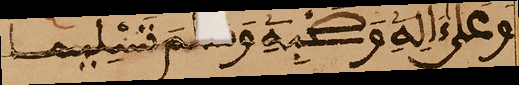وعلى آ إله وصحبه وسلم تسليما
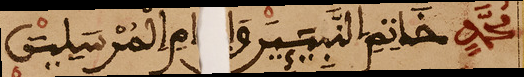محمد خاتم النبيئين وإمام المرسلين
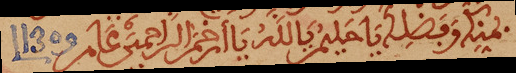منك وفضلك يا حليم يا الله يا أرحم الراحمين تمام
